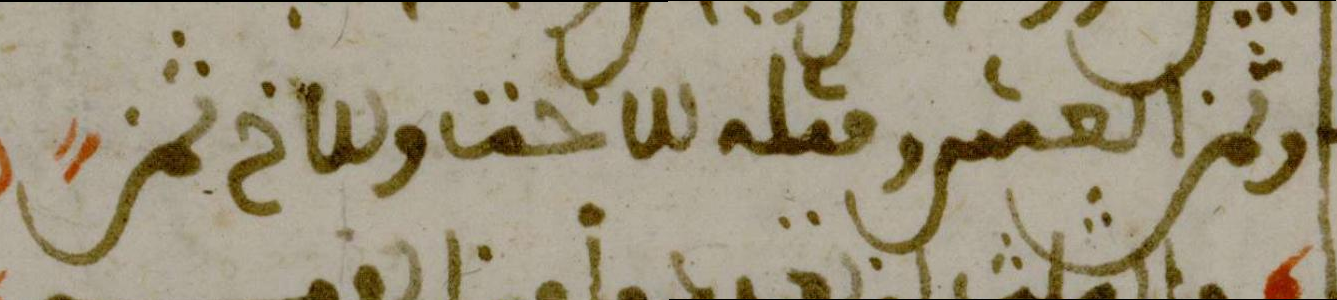وثمن العشر ومثله للاخت وللاخ ثمن
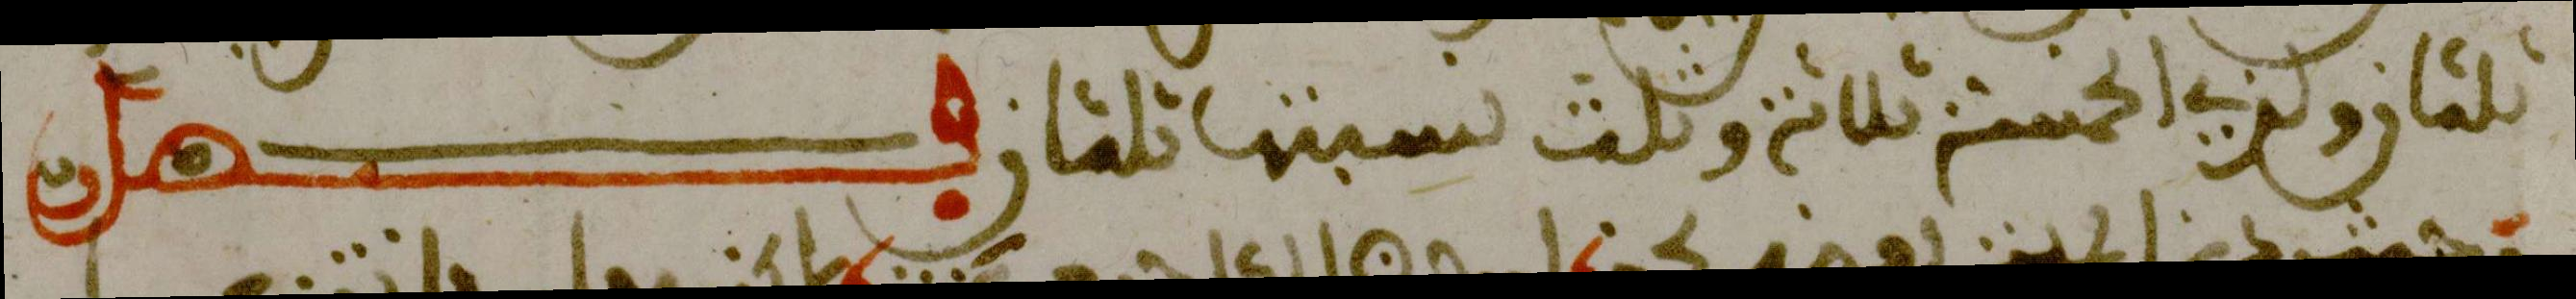ثلثان ولذي الخمسة ثلاثة وثلث نسبتها ثلثان فَصل
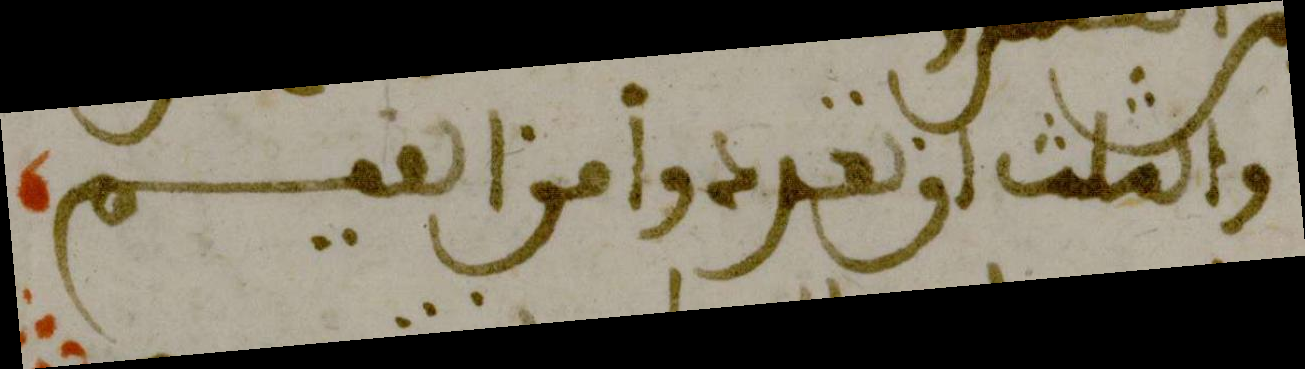والثلث ان تعددوا من القيم
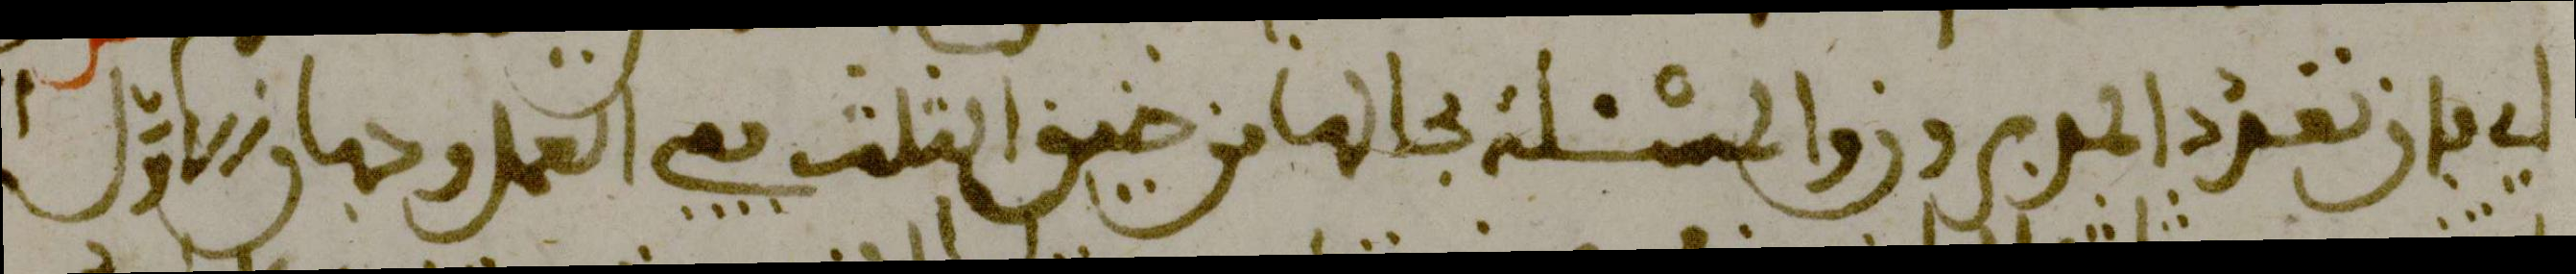اي فان تعدد المدبرون والمسئلة بحالها من ضيق الثلث ففي العمل وجهان الاوّل
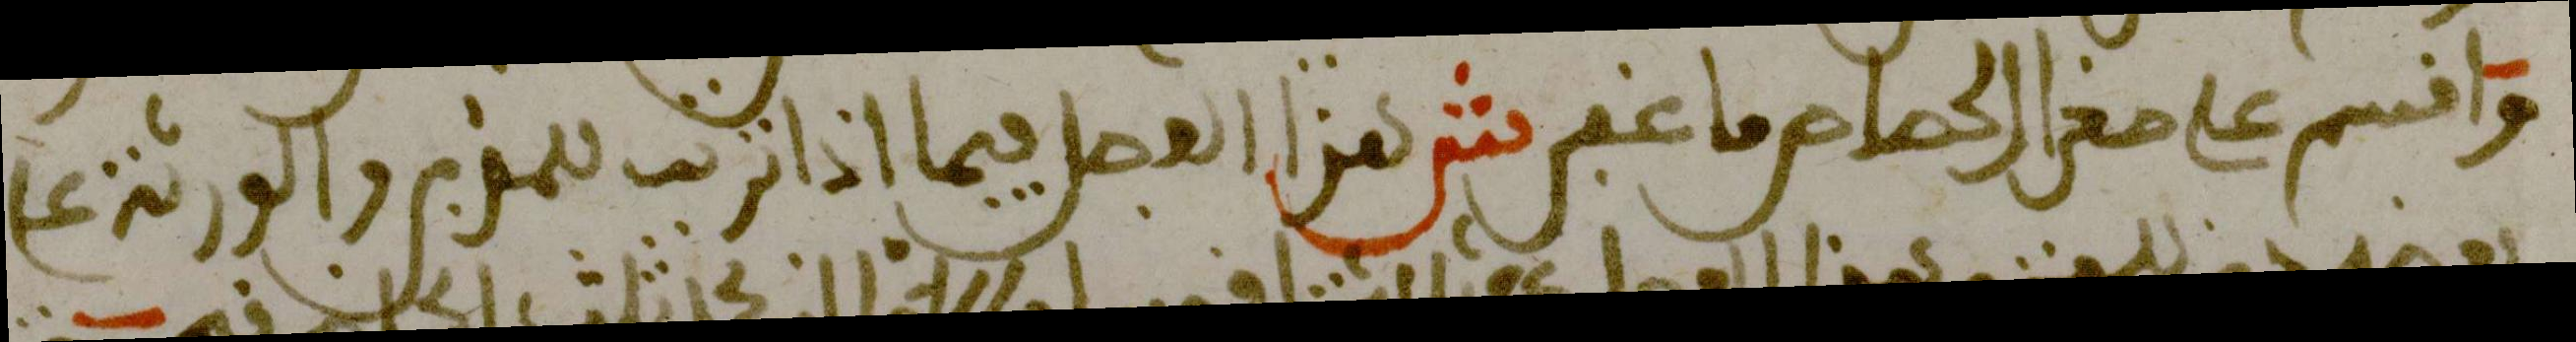وَاقسم على صغرا الحصاص ما غبر ش هذا الفصل فيما اذا ترتب للمدبر والورثة على
